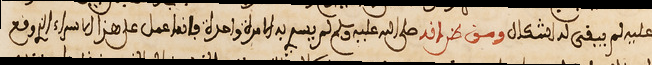عليه لم يبقى له اشكال ومن ظن انه صلى الله عليه وسلم لم يسر به الا مرة واحدة فانما عمل على هذا الاسراء الذي ووقع
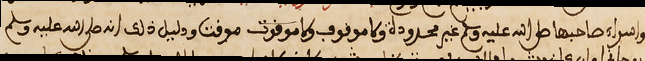واسراء صاحبها صلى الله عليه وسلم غير محدودة ولا موقوف ولا موقوت موقت ودليل ذلك انه صلى الله عليه وسلم
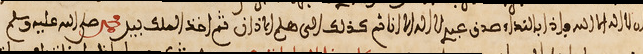ان لا اله الا الله فاذا بالنداء صدق عبدى لا اله الا انا ثم كذلك الى تمام الاذان ثم اخذ الملك بيد محمد صلى الله عليه وسلم
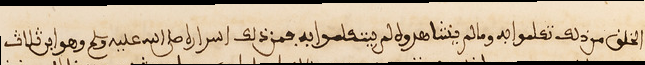الخلق من ذلك تكلموا به وما لم يشاهدوه لم يتكلموا به فمن ذلك اسراره صلى الله عليه وسلم وهو ابن ثلاث
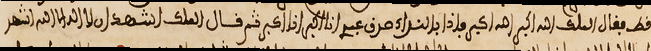قد فقال الملك الله اكبر الله اكبر فاذا النداء صدق عبدى انا اكبر انا اكبر ثم قال الملك اشهد ان لا اله الا الله اشهد
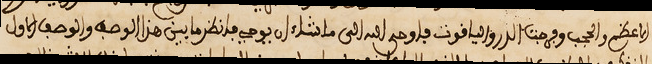الاعظم والحجب وفرحة الدرر والياقوت فاوحى الله الى ما شاء ان يوحي فانظر ما بين هذا الوصف والوصف الاول
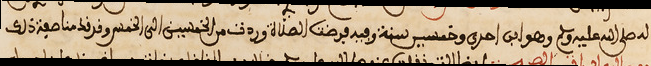له صلى الله عليه وسلم وهو ابن احدى وخمسين سنة وفيه فرضت الصلاة وردت من الخمسين الى الخمس وقد قدمنا صفة ذلك
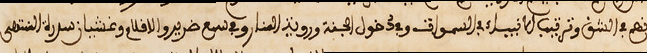نهم في الشق وترتيب الانبيياء في السموات وفي دُخول الجنة وروية النار وفي سمع ضرير والاقلام وغشيان سدرة المنتهى
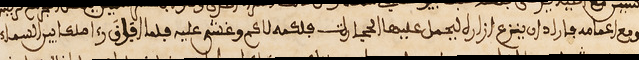ومع اعمامه فاراد ان يتزع ازاره ليحمل عليها الحجارة فلكمه لاكم غشى عليه فلما افَاقَ رءا ملكا بين السماء
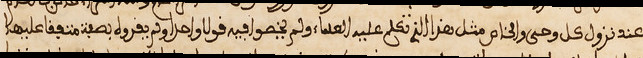عند نزول كل وحى والمخاص مثل هذا الذى تكلم عليه العلماء ولم يخصوا فيه قولا واحدا ولم يقروه بصفة متفقا عليها
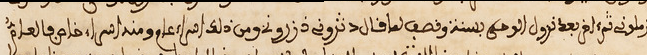زملونى ثم اخر بعد نزول الوحى بسنج نصف لما قال دثرونى ذزونى ومن ذلك اسراء عام ومنه اسراء خاص فالعام
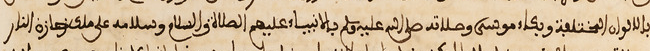بالالوان المختلفة وبكاء موسى وصلاته صلى الله عليه وسلم بالانبياء عليهم الصلاة والسلام وسلامه على ملك خازه النار
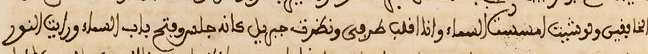الخافقين ولو شيت لمسست السماء وانا اقلب طرفى ونظرت جبريل كانه جلس وفتح باب السماء ورايت النور
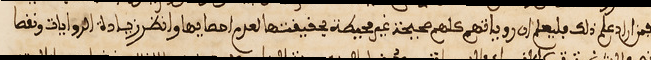فمن اراد على ذلك فليعلم ان روياتهم كلهم صحيحة غير محيطة بحقيقتها لعدم احصايها وانظر زيادة الروايات وونقصا
